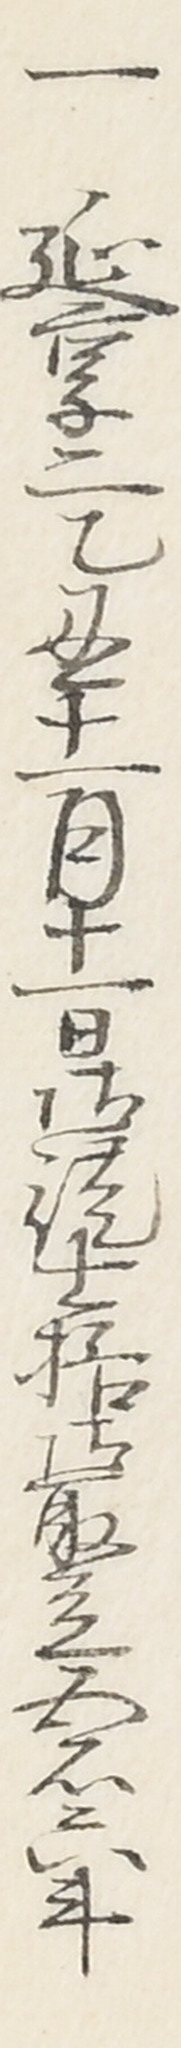一延享二乙丑十一月十一日御徒士格御取立五石六斗
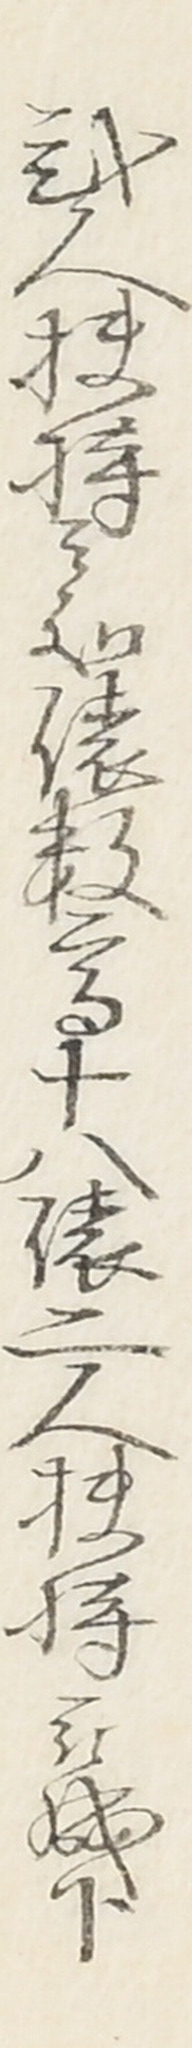弐人扶持之処俵数高十八俵二人扶持被成下
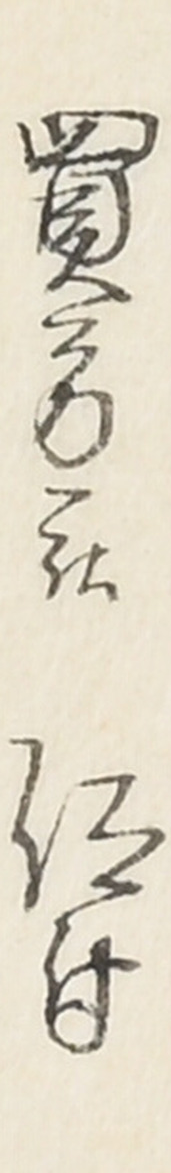買方被仰付
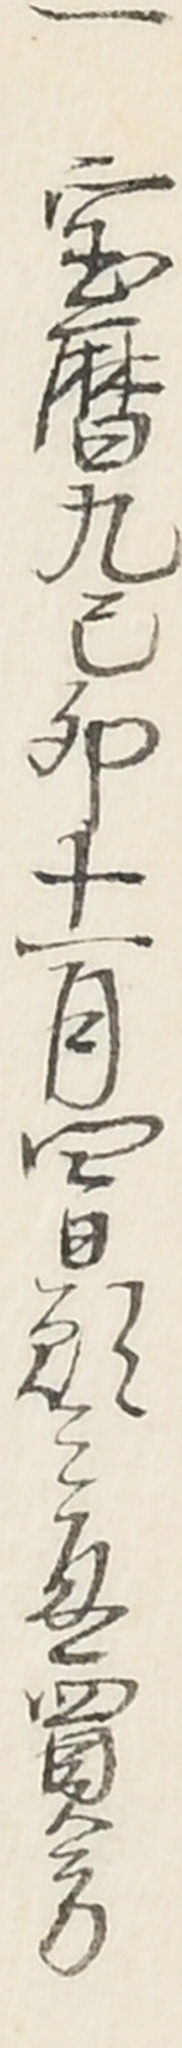一宝暦九己卯十一月四日願之通買方
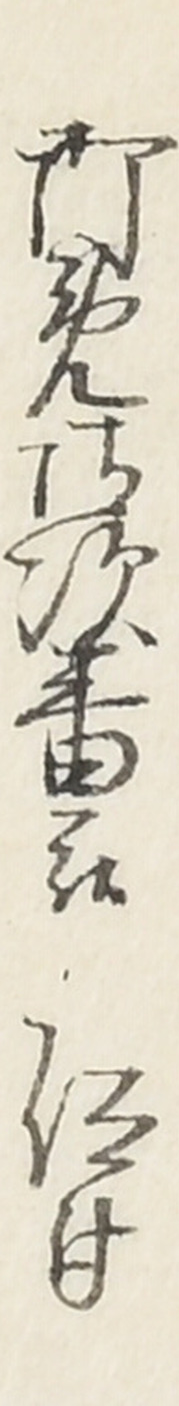御免御次番被仰付
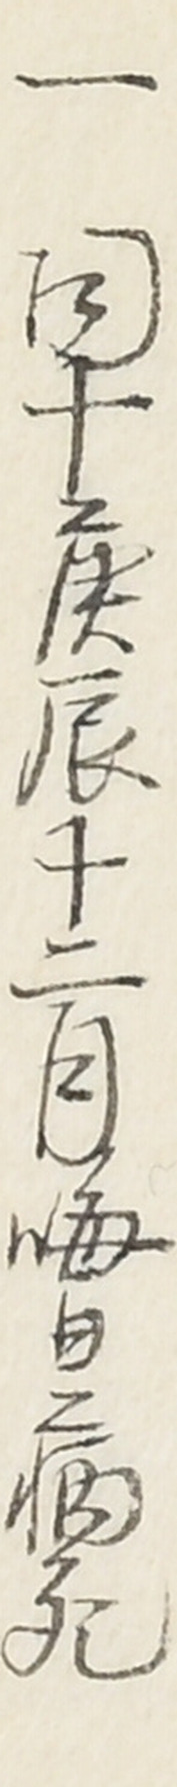一同十庚辰十二月晦日病死
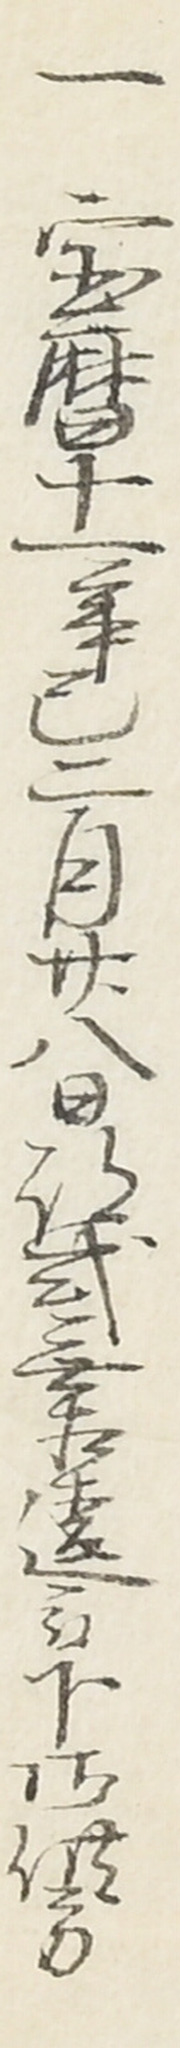一宝暦十一辛巳二月廿八日跡式無相違被下御供方
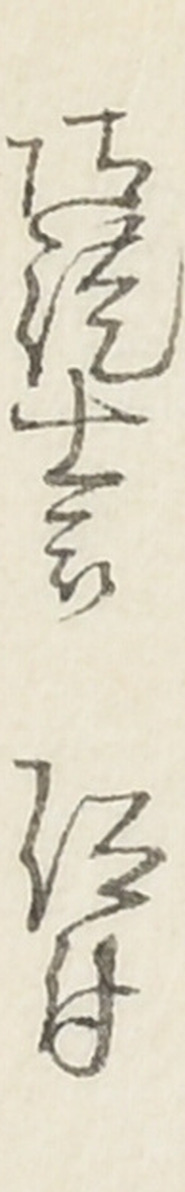御徒士被仰付
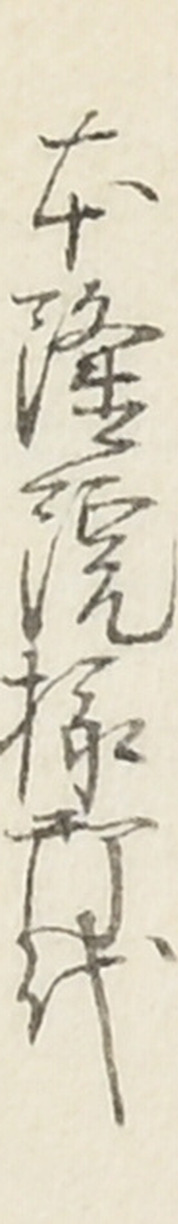本隆院様御代
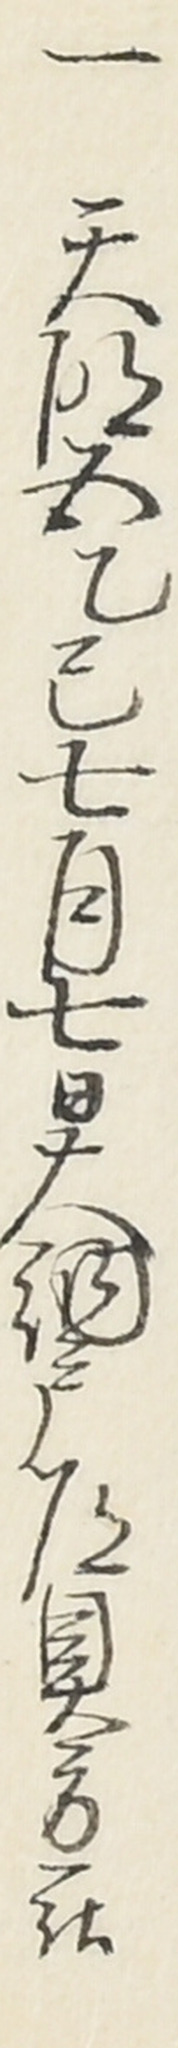一天明五乙巳七月七日大納戸道具方被
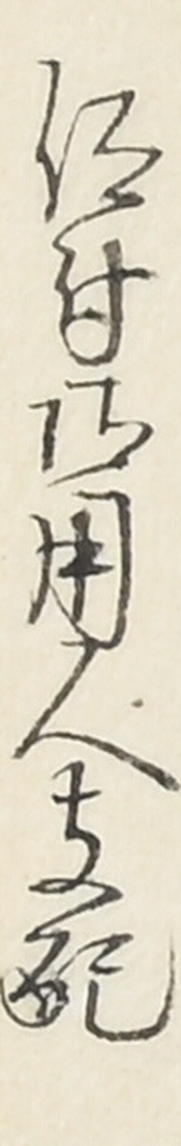仰付御用人支配

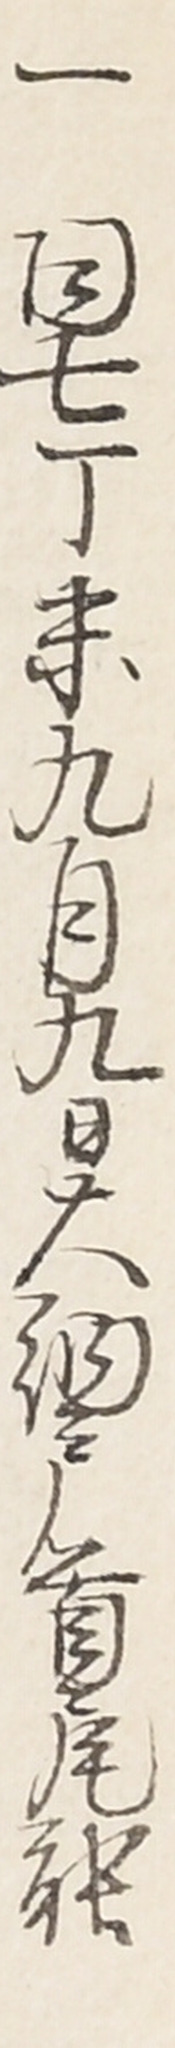一同七丁未九月九日大納戸首尾能
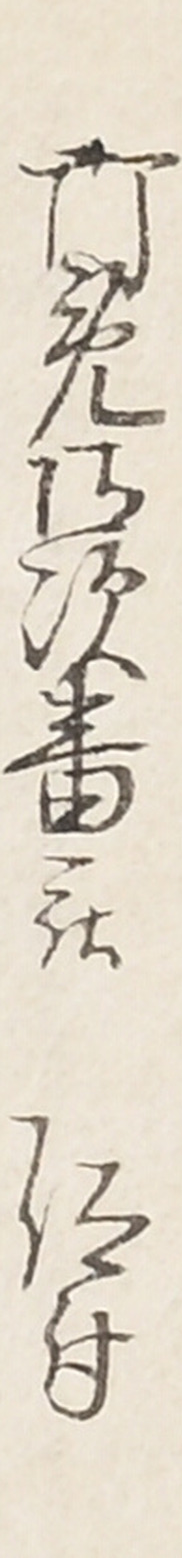御免御次番被仰付
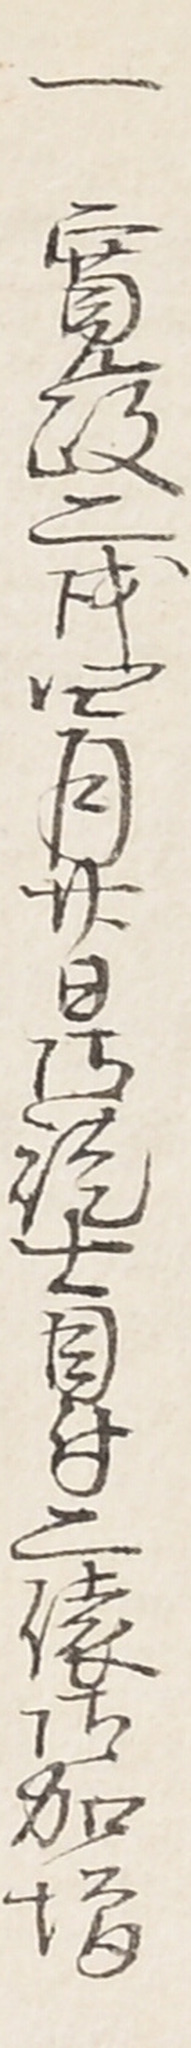一寛政二戌四月廿日御徒士目付二俵御加増
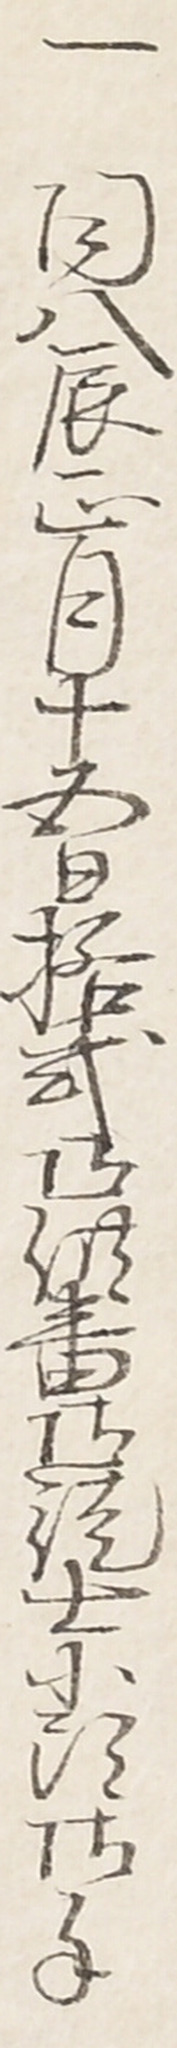一同八辰正月十五日格式御供番御徒士小頭御手
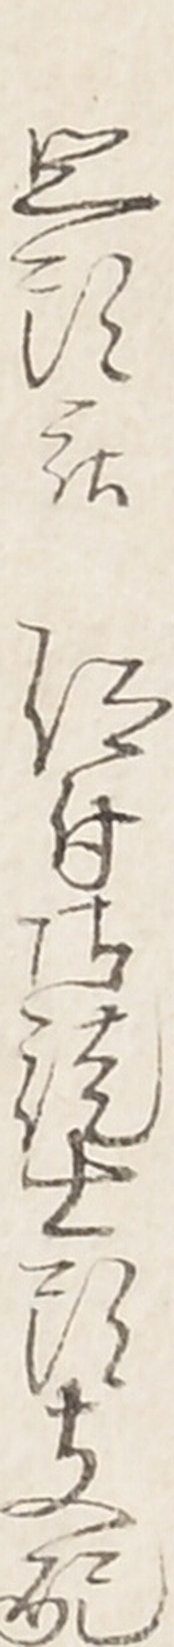廻頭被仰付御徒士頭支配
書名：無足諸士勤仕録（四）
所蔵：伊那市立高遠町図書館・合同会社AMANE
